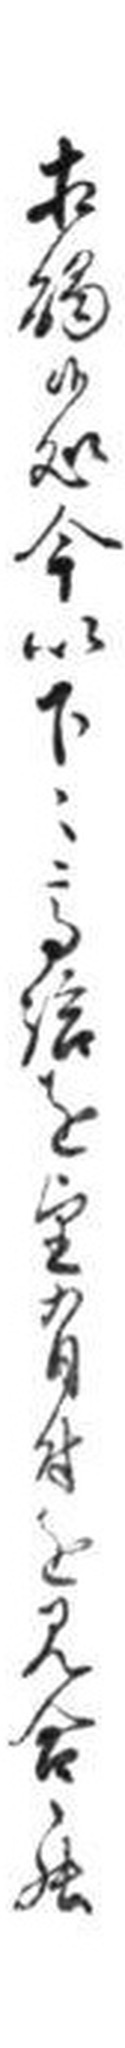相触候処今以下々高給を望有付を見合罷
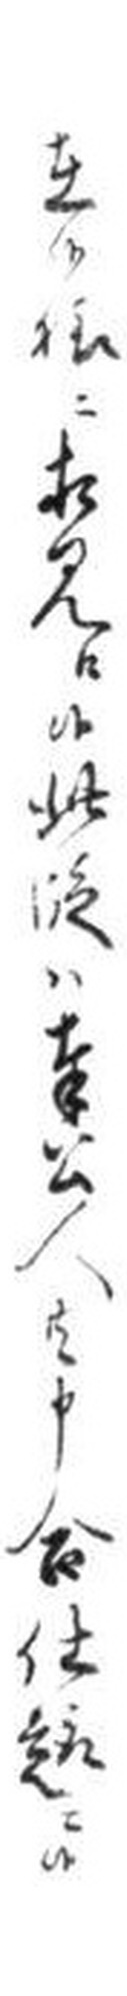在候様荷ニ相見江候此段ハ奉公人共申合仕趣ニ候
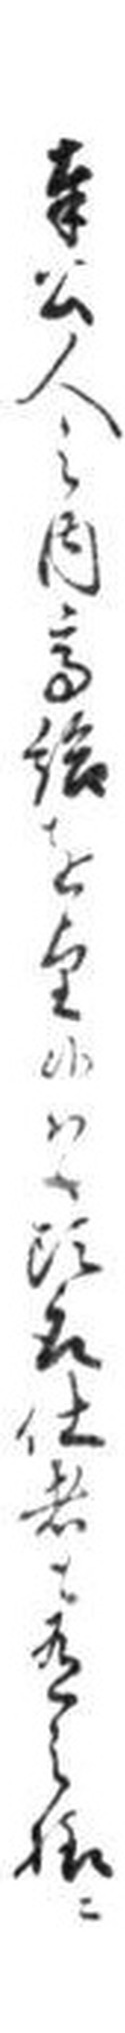奉公人之内高給を望候ハヽ頭取仕者も有之様ニ
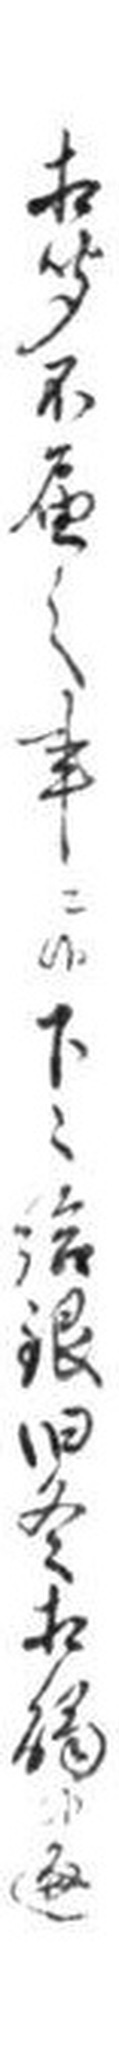相聞不届之事ニ候下々給銀旧冬相触候通
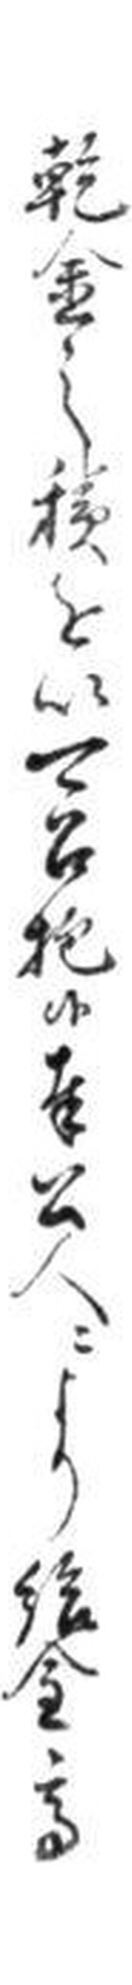乾金之積を以可めす召抱候奉公人ニより給金高
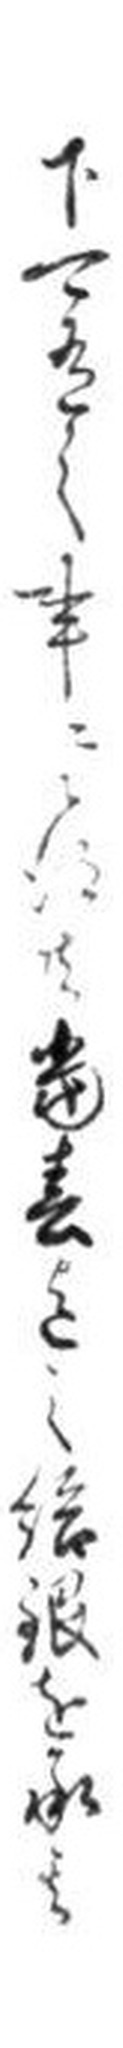下可有之事ニ候得共当春迄之給銀を承其
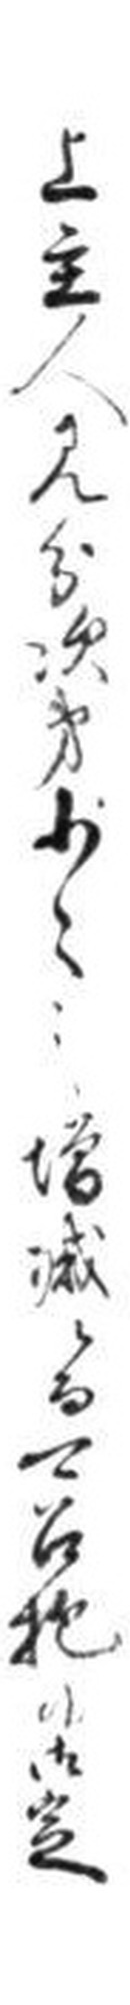上主人見分次第少々之増減ニ而可召抱候御定
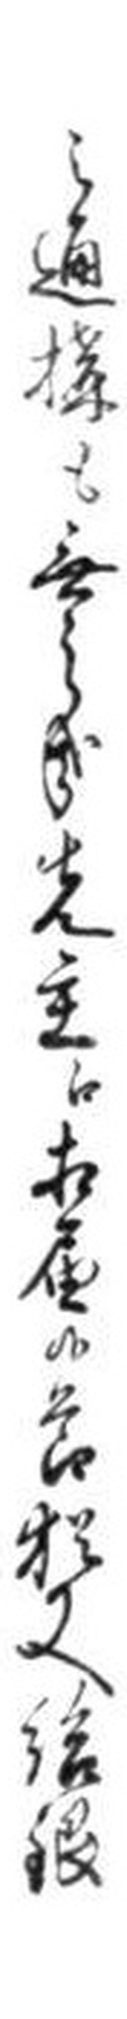之通構も無之哉先主江相届候節猶又給銀
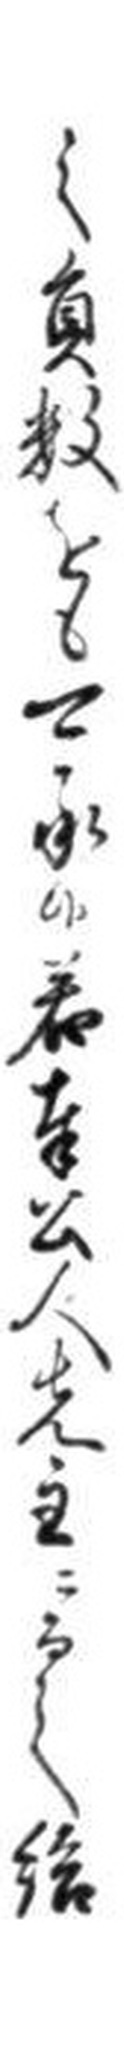之員数をも可承候若奉公人先主ニジ而之給
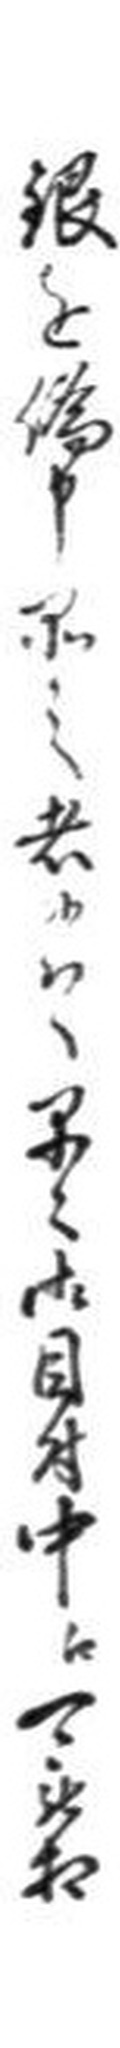銀を偽申品之者候ハヽ品々御目付中江可被相
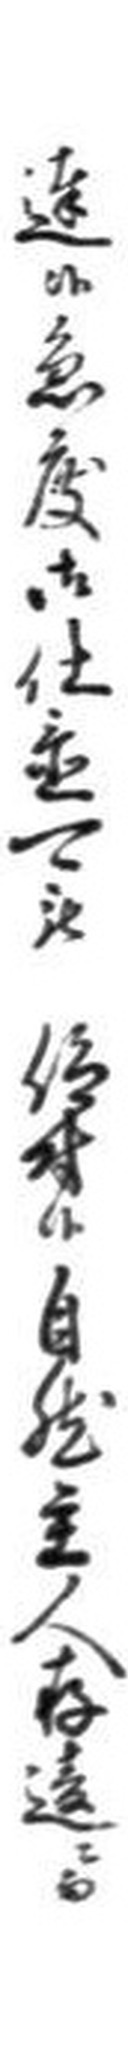達候急度御仕置可被仰付候自然主人存違ニ而
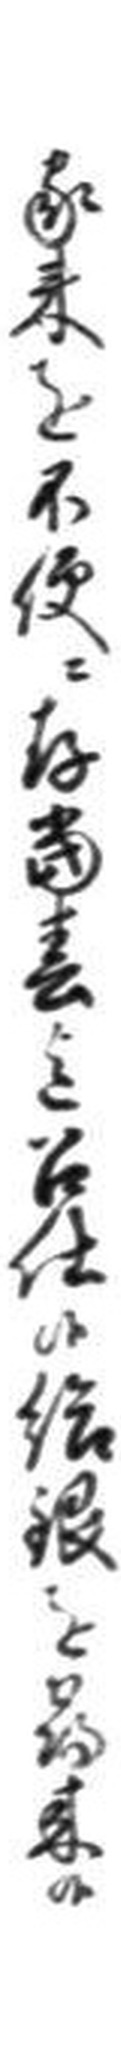家来を不便ニ存当春迄召仕候給銀を尋来候
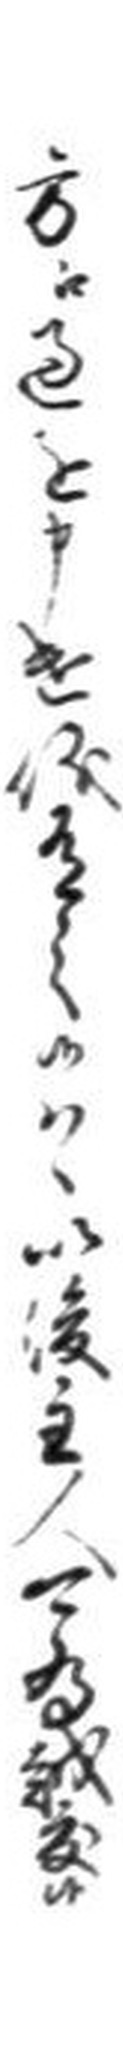方江過を申遣儀有之候ハヽ以後主人可為越度候
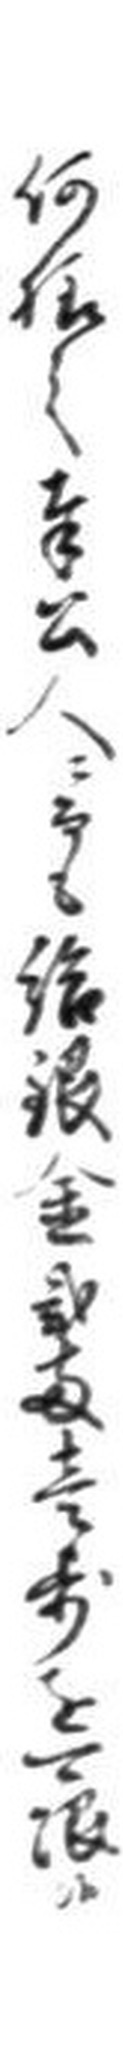何様之奉公人ニ而も給銀ｋ金弐両壱歩を可限候
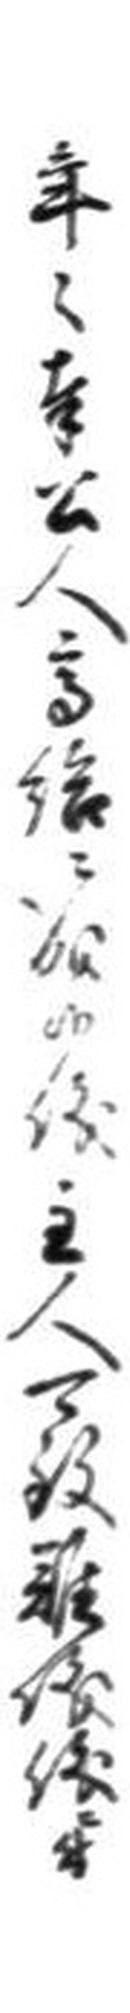年々奉公人高給ニ成候儀主人可致難儀儀ニ付
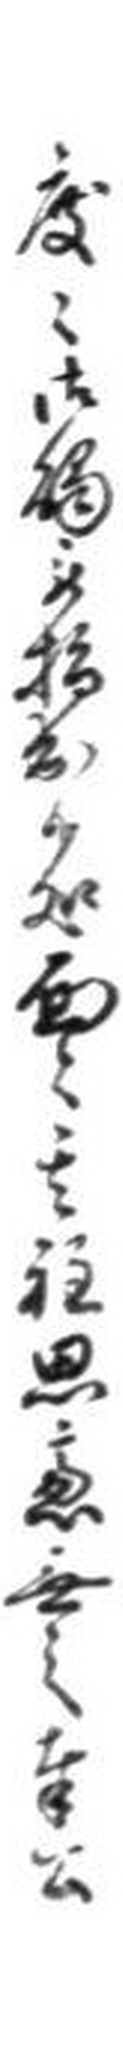度々御触被指出候処面々其程思慮無之奉公
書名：家譜 三十四 吉邦公 従享保五年到同六年
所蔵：福井県文書館 Fukui Prefectural Archives
